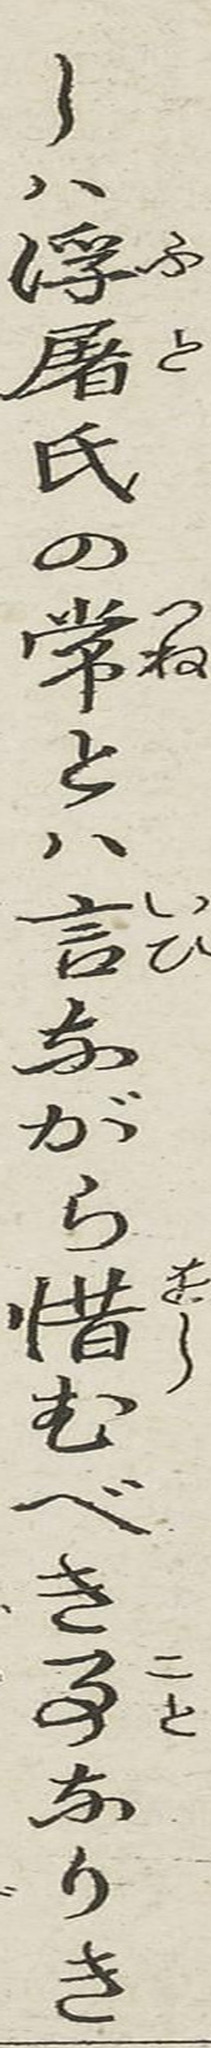しは浮屠氏の常とは言ながら惜むべき事なりき
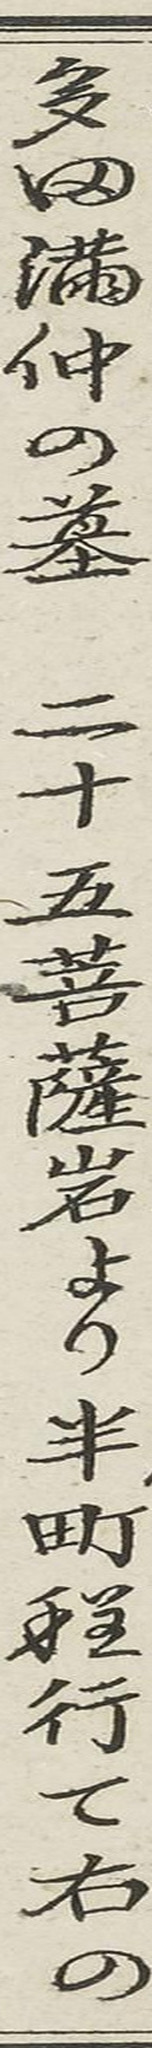多田満仲の墓二十五菩薩岩より半町程行て右の
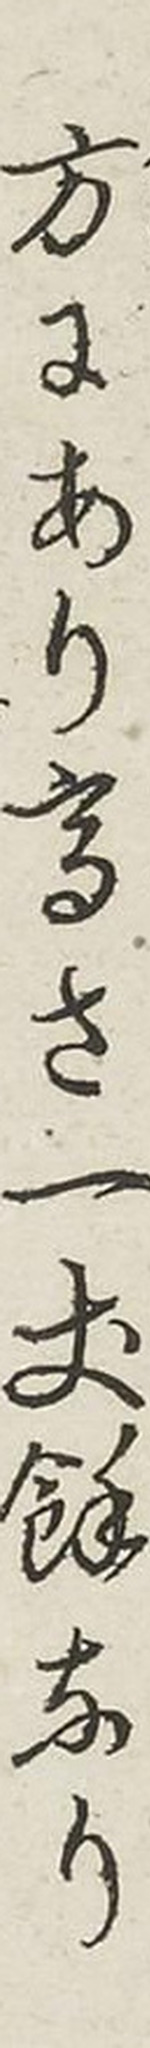方にあり高さ一丈餘なり
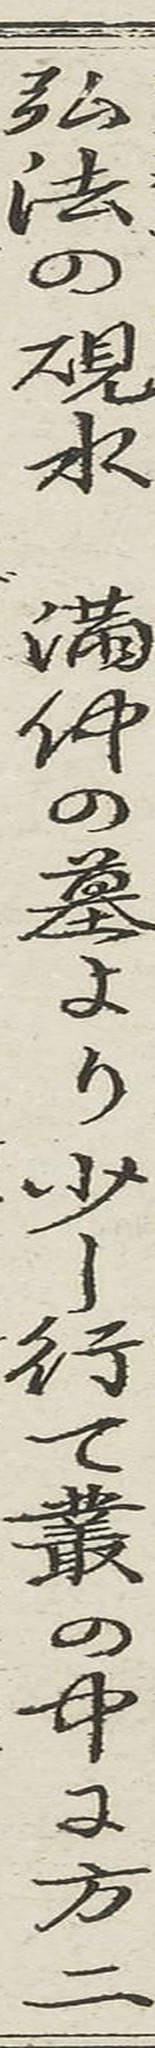弘法の硯水満仲の墓より少し行て叢の中に方二
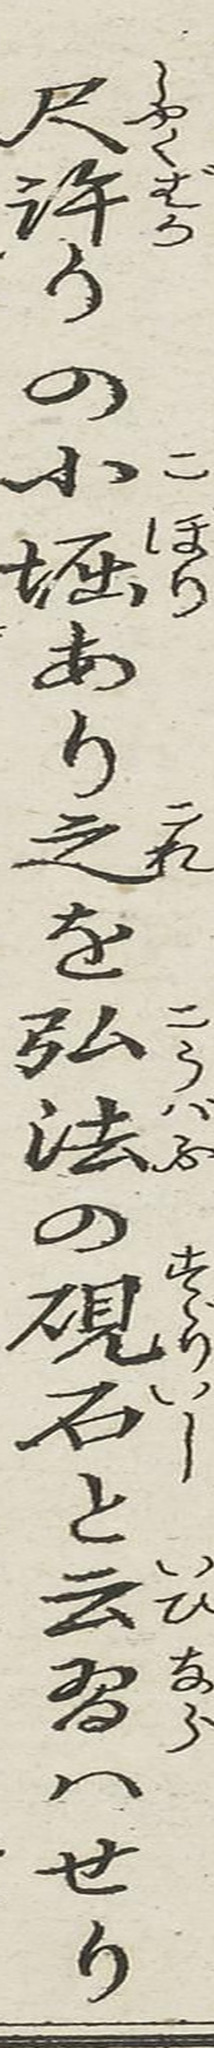尺許りの小掘あり之を弘法の硯石と云習はせり
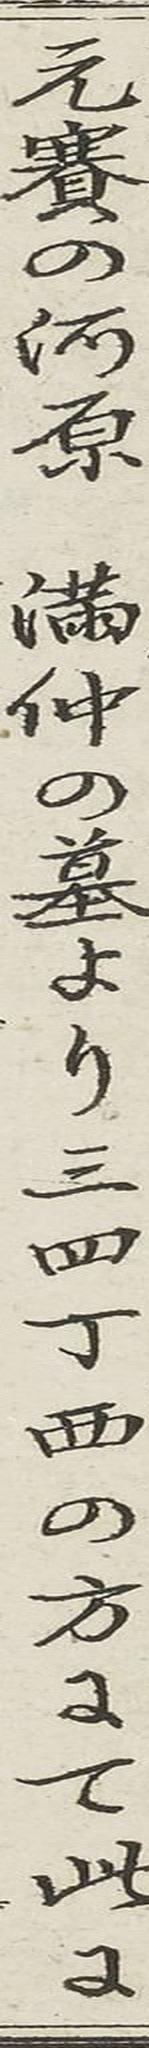元賽の河原満仲の墓より三四丁西の方にて此（こゝ
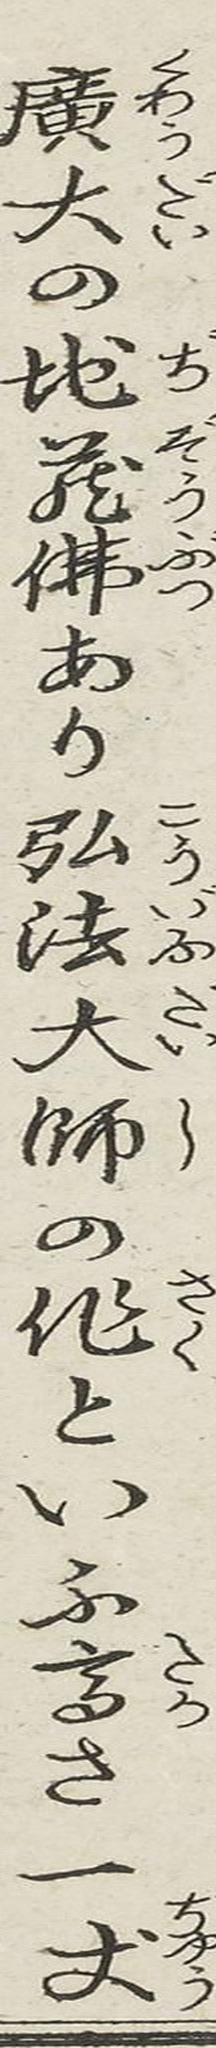廣大の地蔵佛あり弘法大師の作といふ高さ一丈
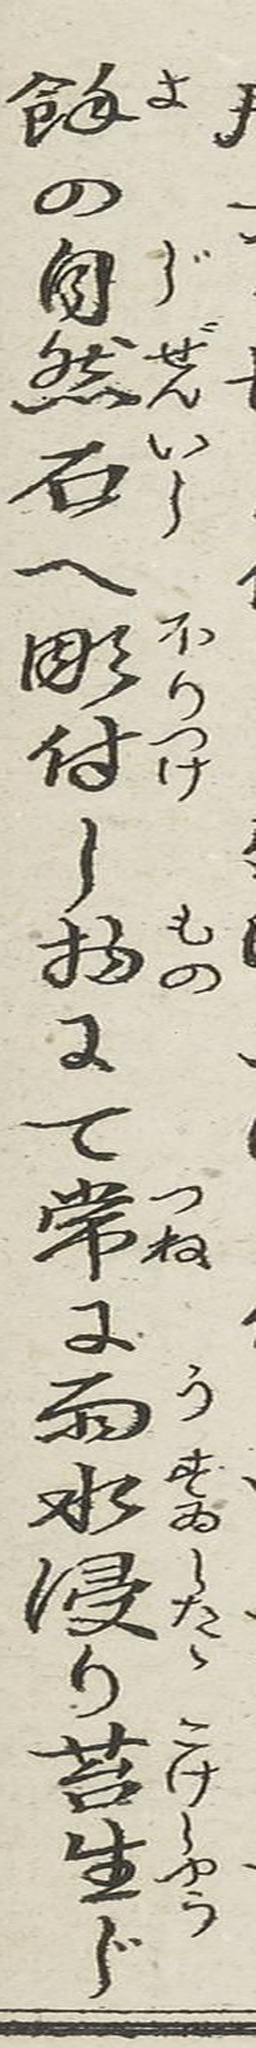餘の自然石へ彫付し物にて常に雨水浸り苔生じ
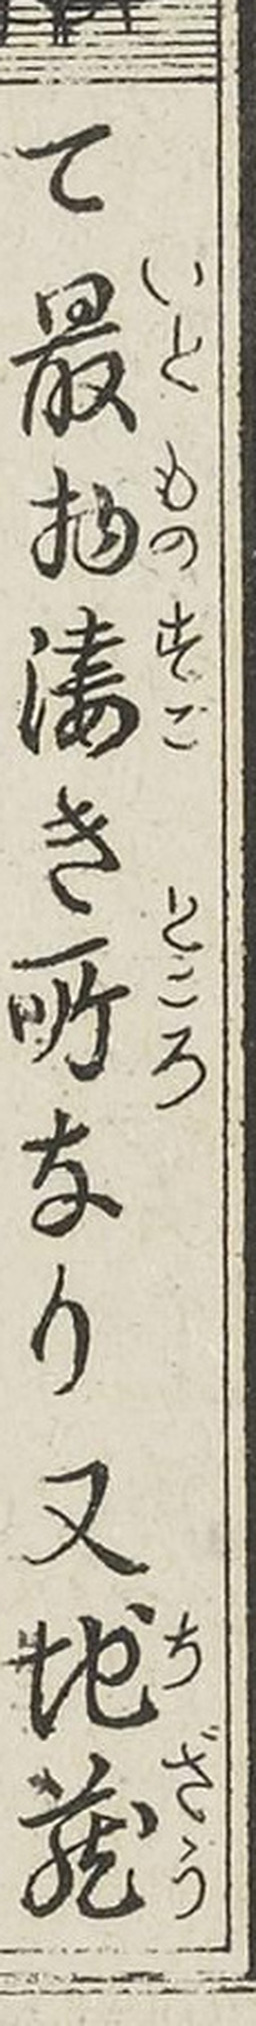て最物凄き所なり又地蔵
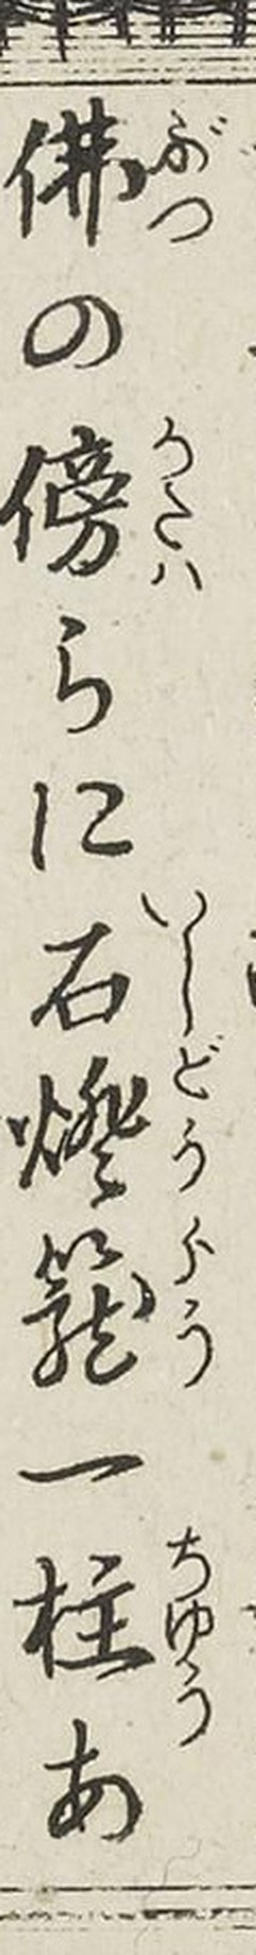佛の傍らに石燈籠一柱あ
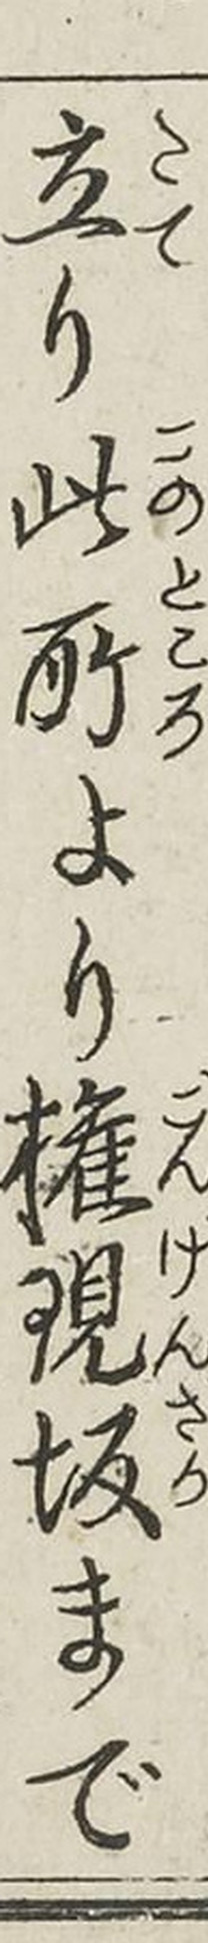地立り此所より権現坂まで
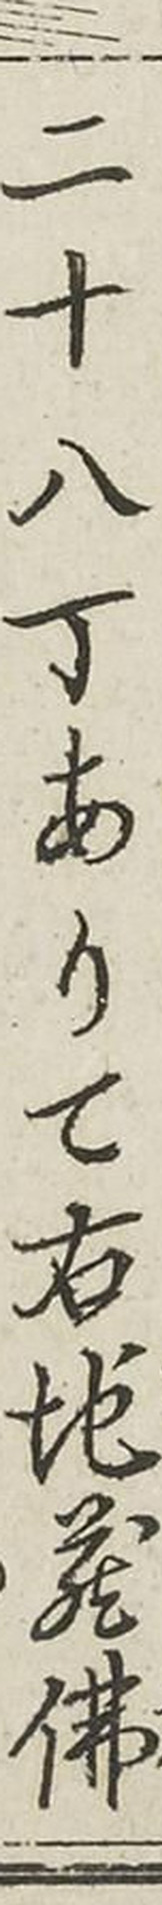蔵二十八丁ありて右地蔵佛
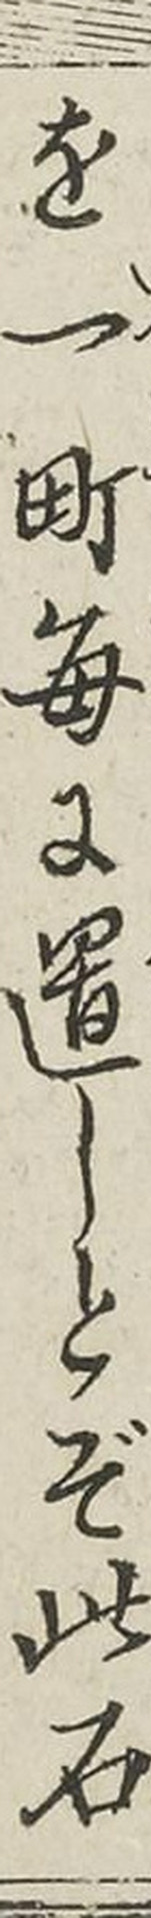堂を一町毎に置しとぞ此石

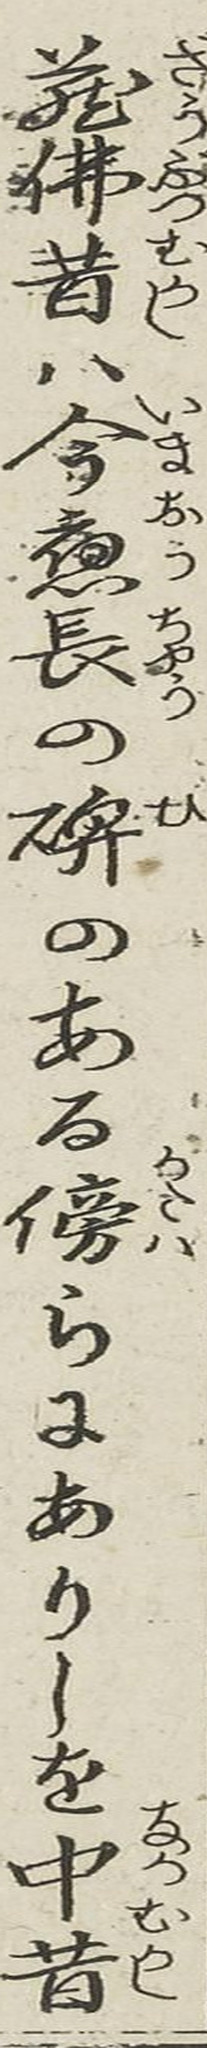蔵佛昔は今応長の碑のある傍らにありしを中昔
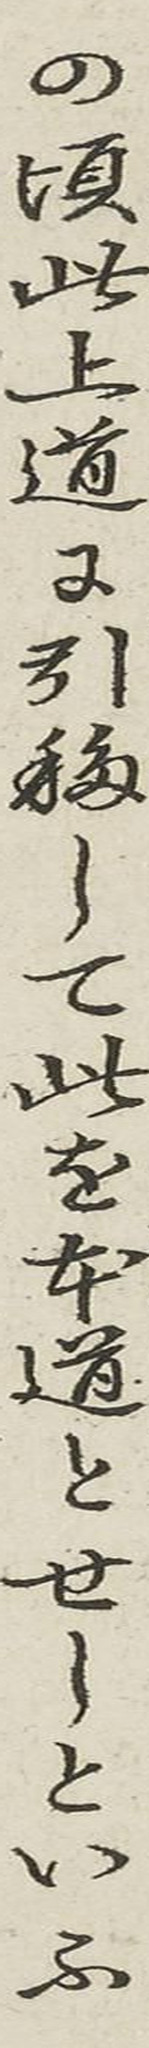の頃此上道に引移して此を本道とせしといふ
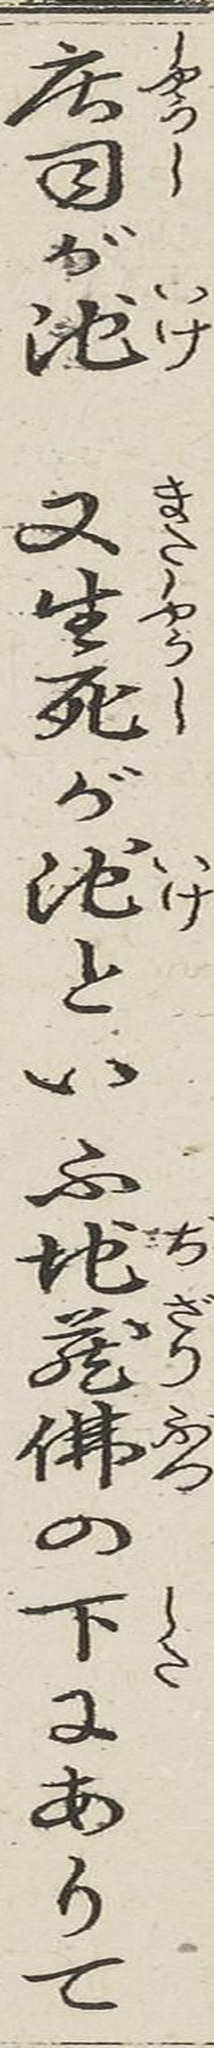庄司が池又生死が池といふ地蔵佛の下にありて
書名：箱根温泉誌　全
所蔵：東京大学地震研究所図書室 Earthquake Research Institute Library, The University of Tokyo, JAPAN
